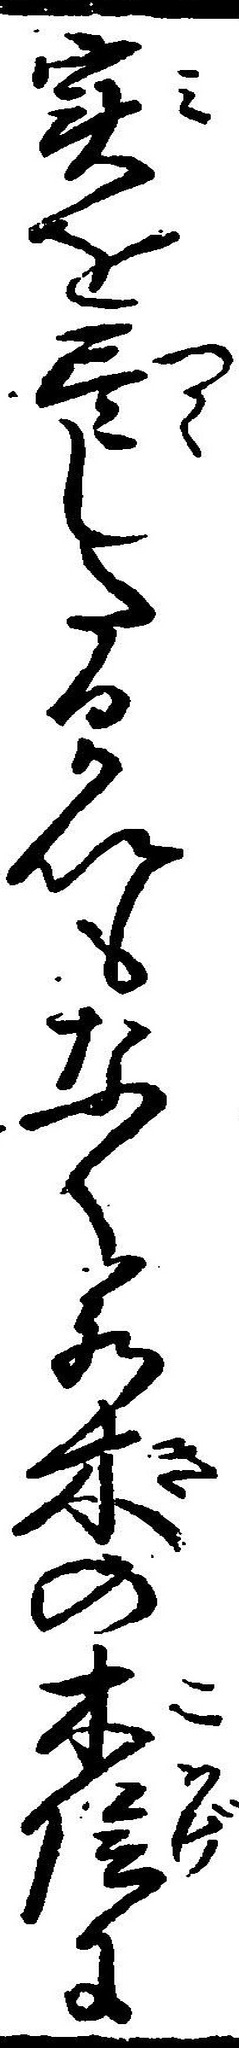実を尽したるかいもなく水木の木陰に
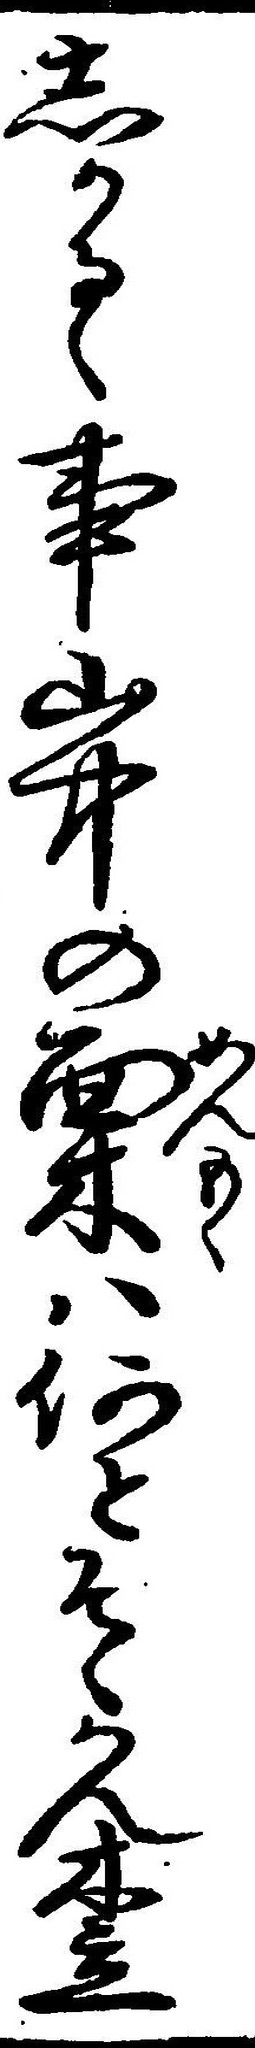しかるゝ事山中の面木は何とそゝかん木立
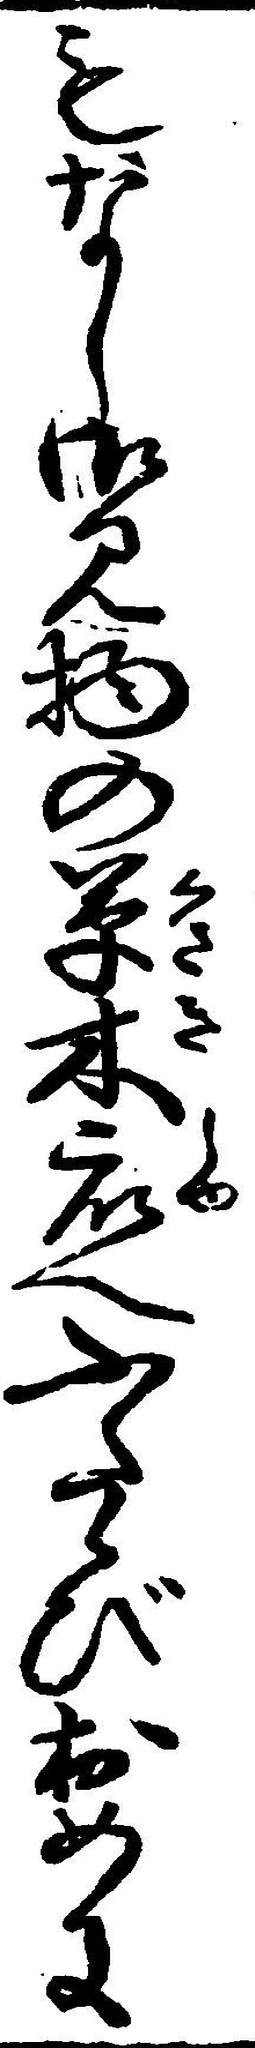もなし御見物の草木衆へふたゝびおめに
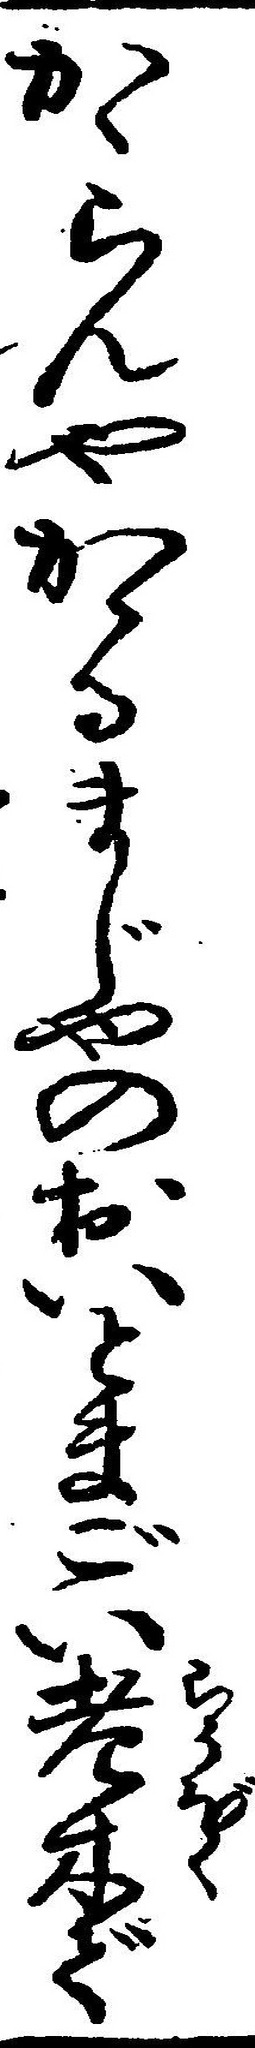かゝらんやかゝるまじやのおいとまごい老木で
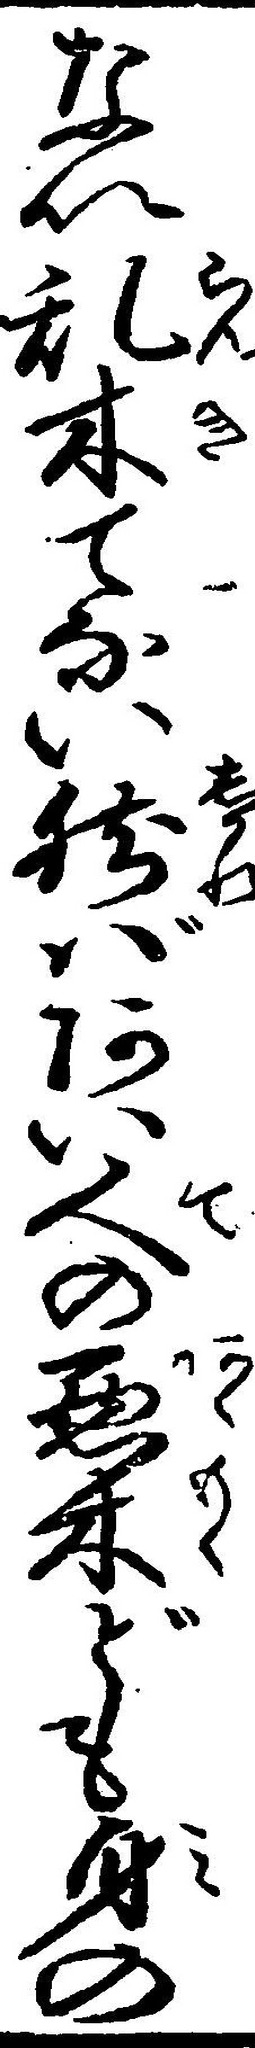ない乱木てない然ばあい人の悪木ども身の

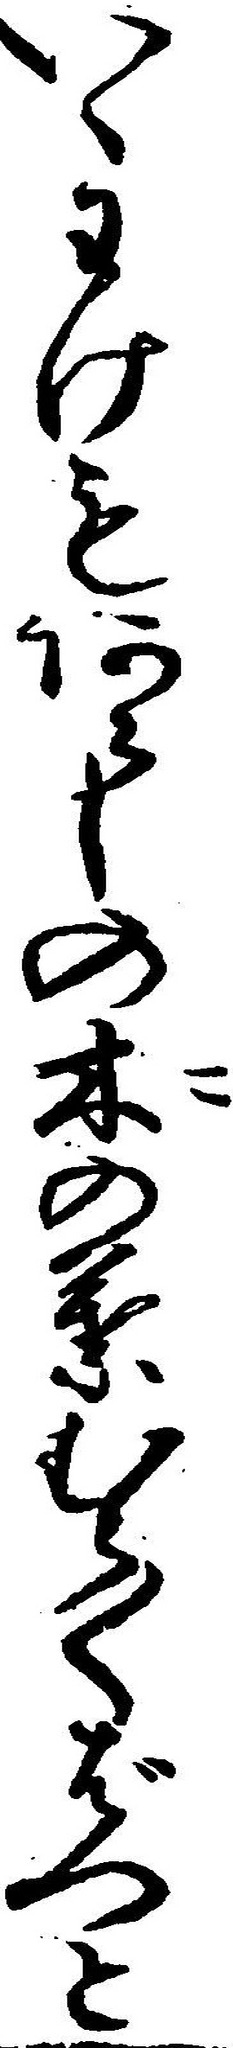いゝわけもあらしの木の葉むら〳〵ばつと
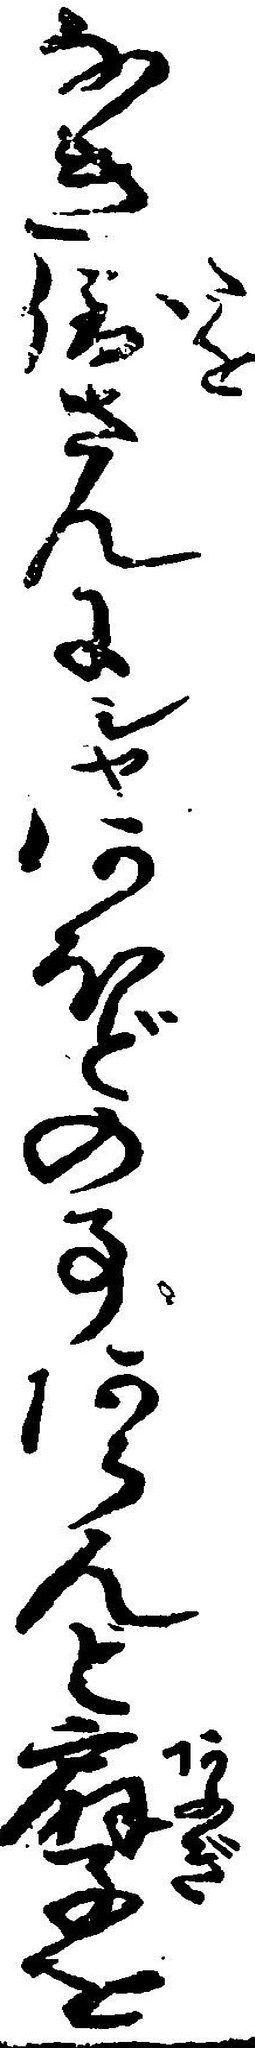なき倒さんにシヤ何ほどの事あらんと扇子を
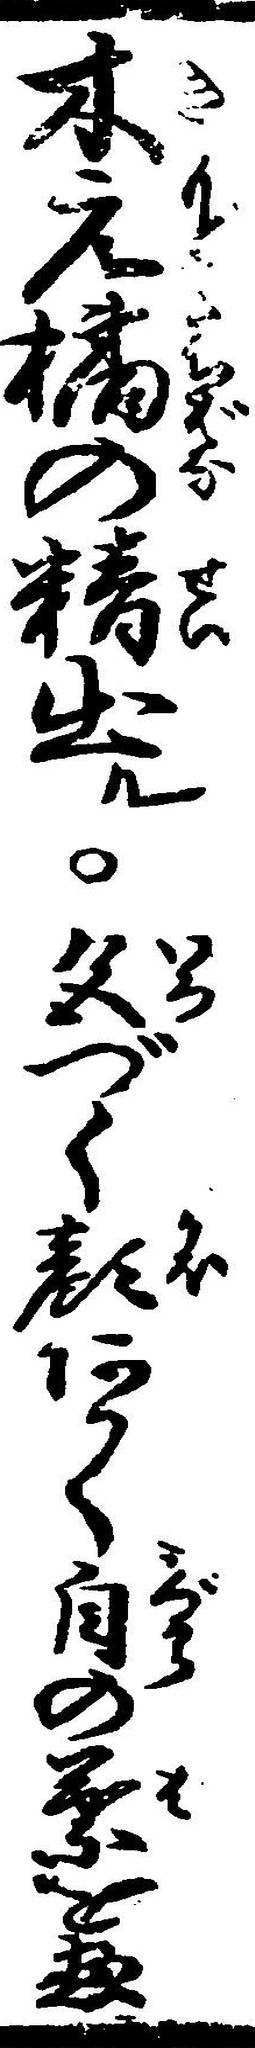木元橘の精出○色づく顔あかく自の葉を惣
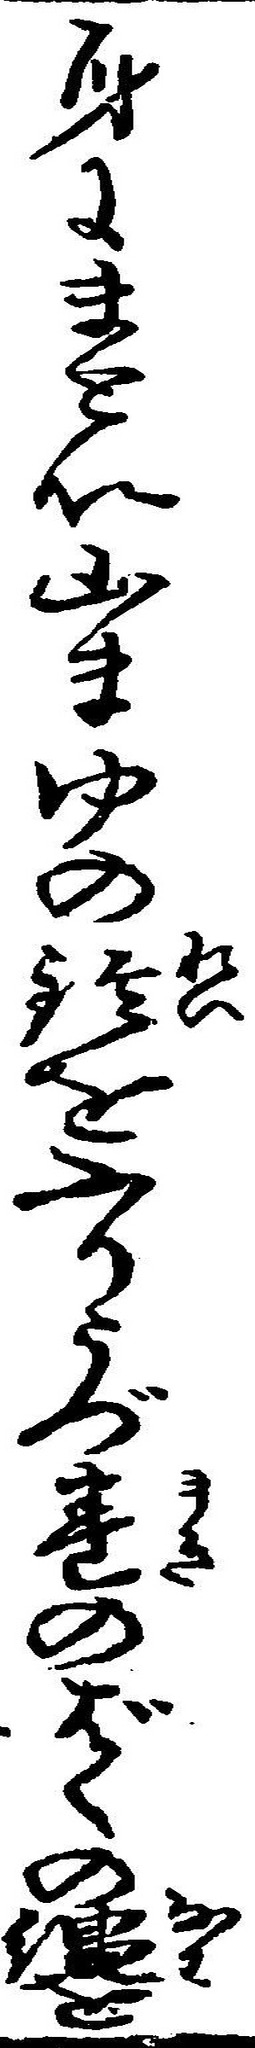身にまとい山まゆの鈴をふりうづ巻のばくの縄を
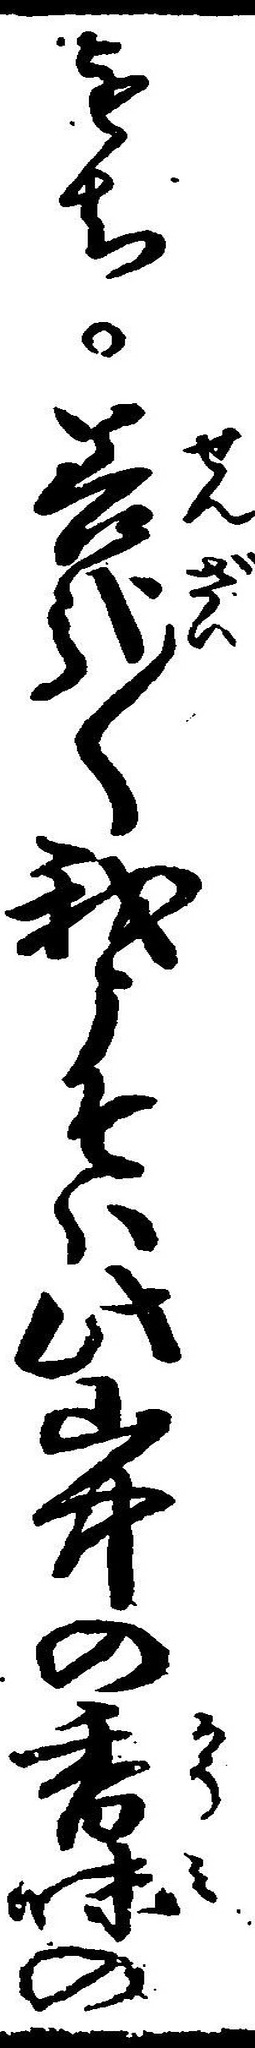もち○善哉〳〵我こそは此山中の香味の
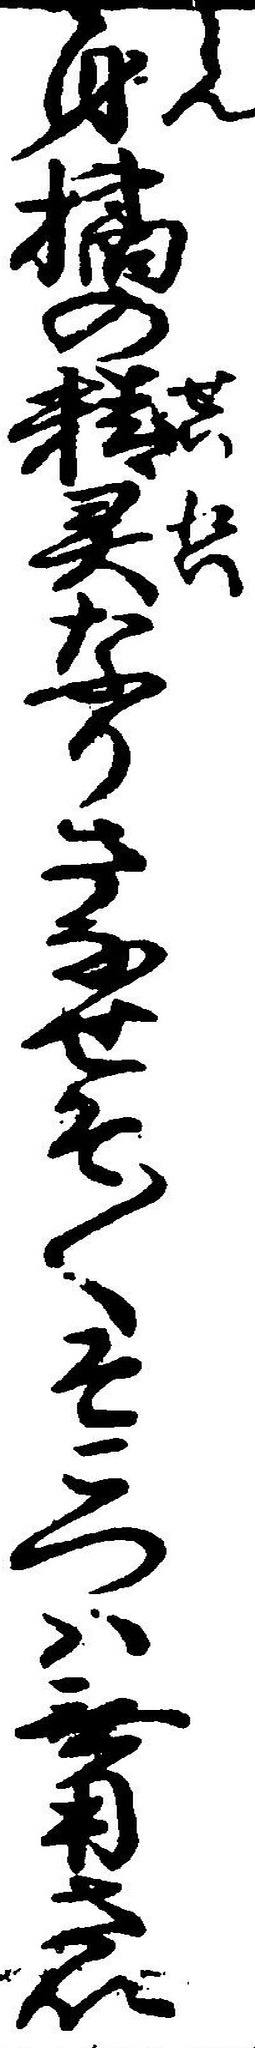身橘の精霊なりさなせそ〳〵そこつは無用さい
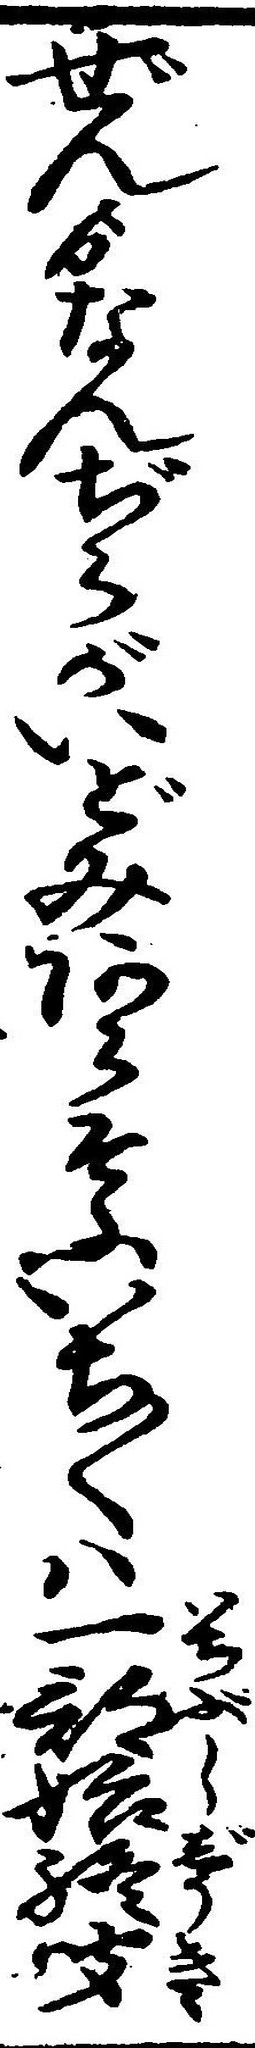ぜんゟなんぢらがいどみあらそふいち〳〵は一部始終聞
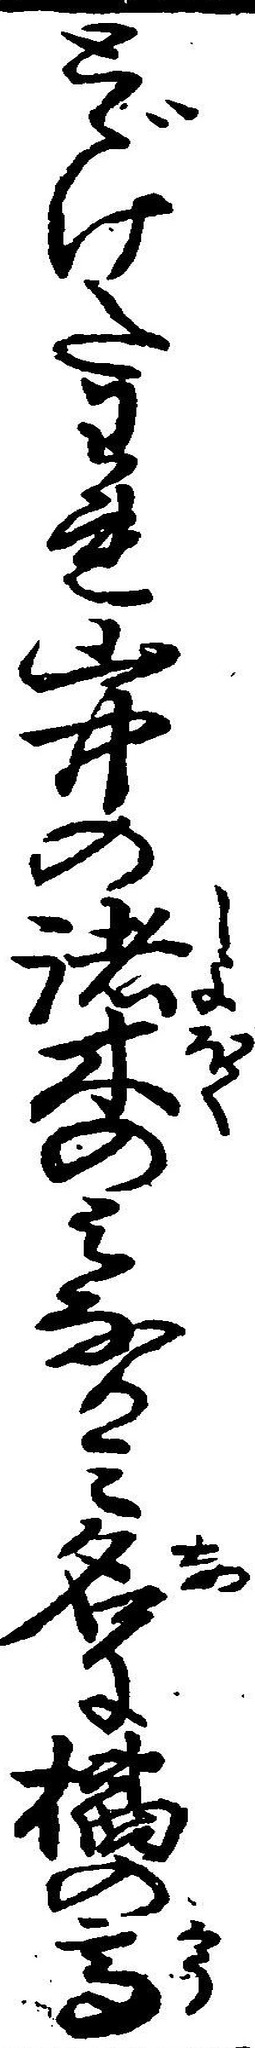とゞけたわれ山中の諸木のみなかみ名に橘の高
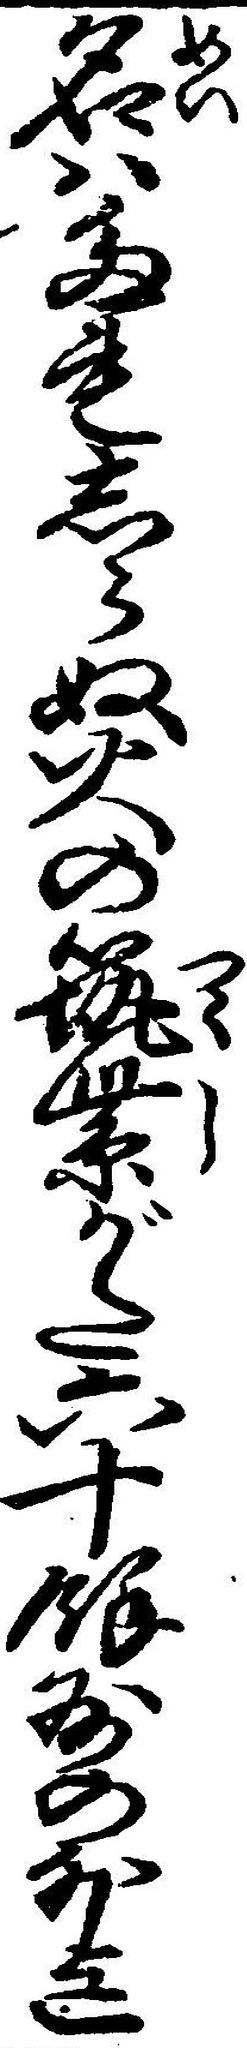名はたれしらぬ火の筑紫がた六十余州の外迄
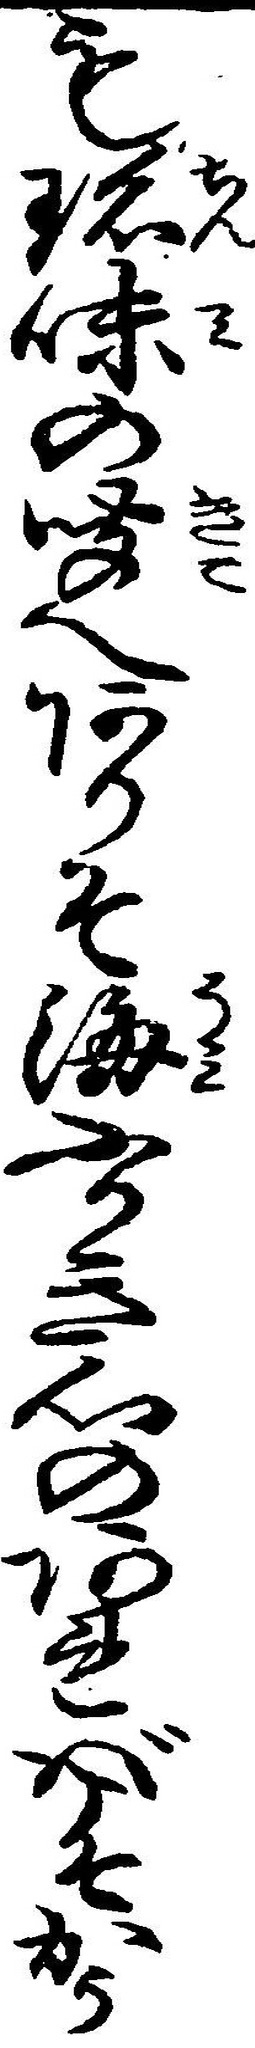も珍味の聞へありそ海ふかき心のあればこそかう
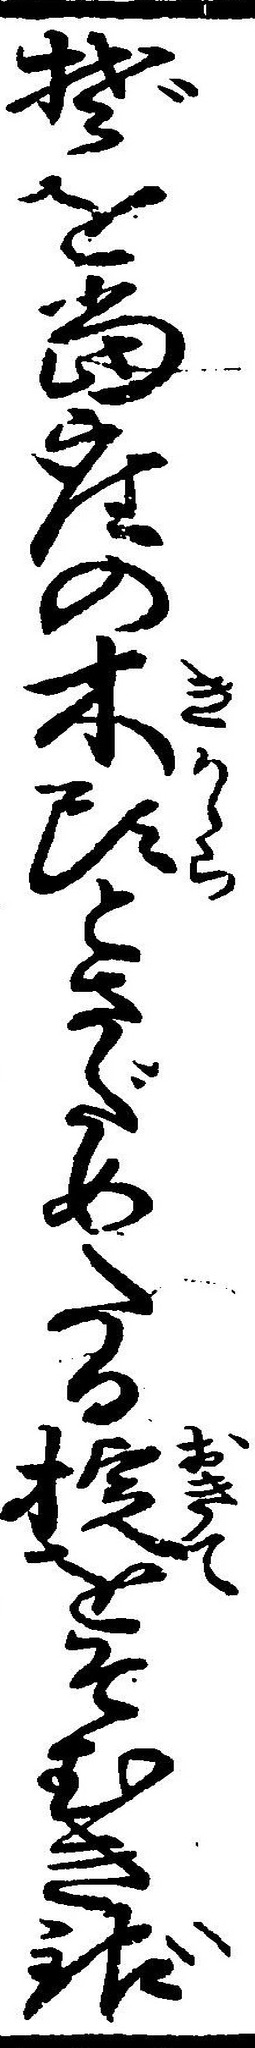ぞを当座の木頭とさだめたる掟をそむき銀
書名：草木芝居化物退治 / 泉花堂三蝶(十六兵衛)作
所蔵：東京大学総合図書館 General Library in the University of Tokyo, JAPAN
